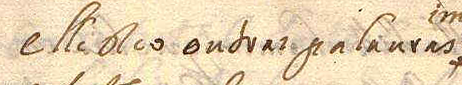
elle Reo outras palauras
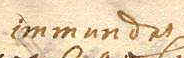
immundas
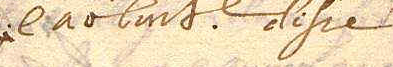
e ao Cust.e disse
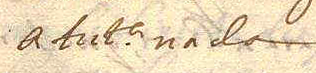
a test.a nada
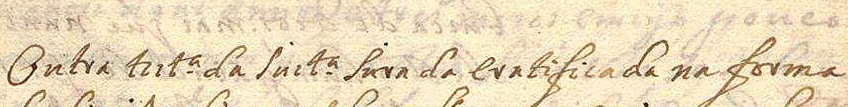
Outra test.a da Iust.a Iurada e ratificada na forma
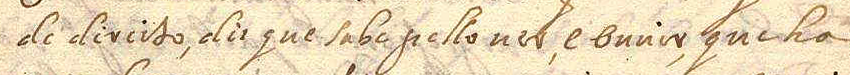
de direito, dis que sabe pello uer, e ouuir, que ha
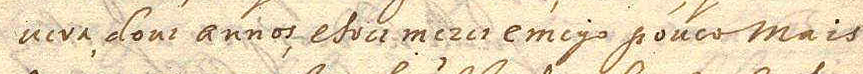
uera dous annos, e tres mezes e meyo pouco mais
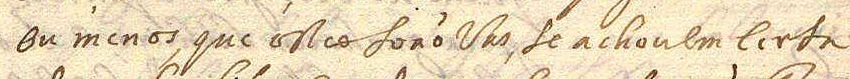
ou menos, que o Reo Joaõ Vas, se achou em certa
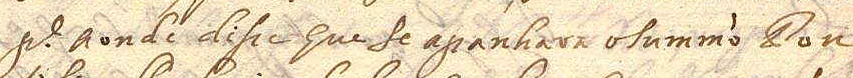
p.e aonde disse que se apanhara o Summo Pon
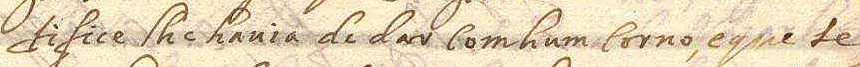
tifice lhe hauia de dar com hum corno, e que se
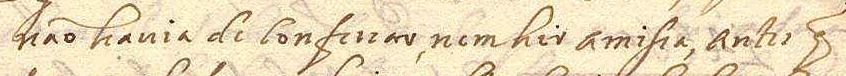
não hauia de Confessar, nem hir a missa, antes q̄
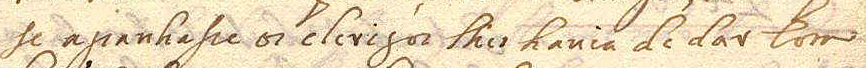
se apanhasse os clerigos lhes hauia de dar Com
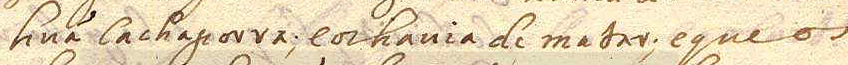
huā Cachaporra; e os hauia de matar, e que os
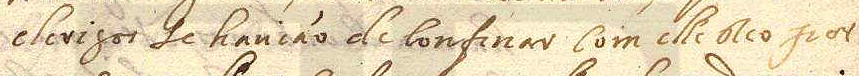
clerigos se hauiaõ de confessar com elle Reo por
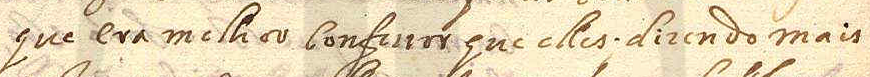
que era melhor confessor que elles. dizendo mais
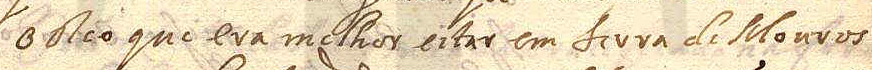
o Reo que era melhor estar em terra de Mouros
